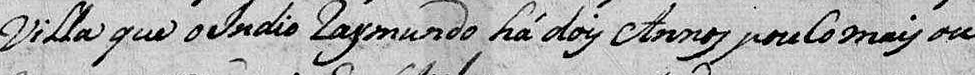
Villa que o Indio Raymundo há dois Annos pouCo mais ou
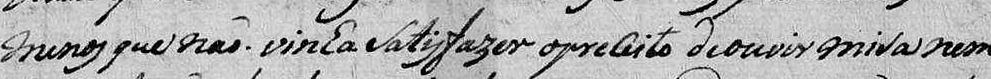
menos que não vinha satisfazer o preCeito de ouvir misa nem
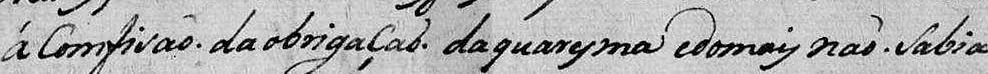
á Comfisaõ. da obrigaÇaõ da quaresma e do mais naõ sabia
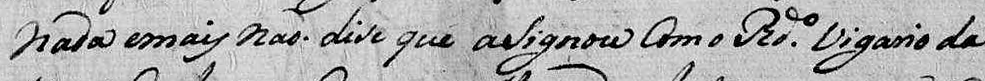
nada e mais naõ. dise que asignou com o Rd.o Vigario da
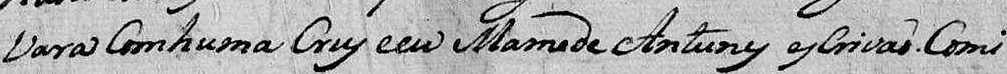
Vara Com huma Crus e eu Mamede Antunes esCrivaõ. Comi
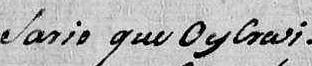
sario que O esCrevi.
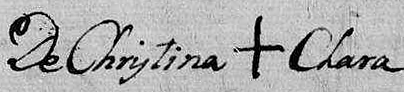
de Christina + Clara
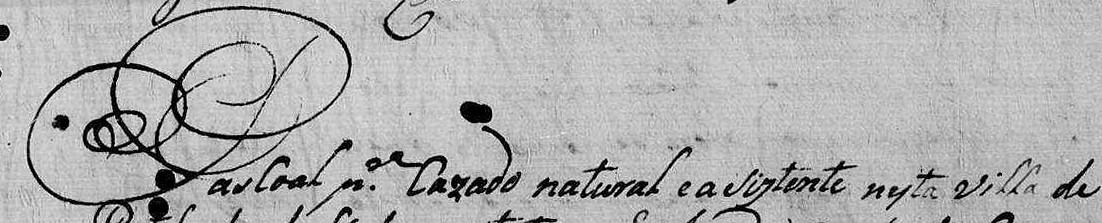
PasCoal p.ra Cazado, natural, e asistente nesta villa de
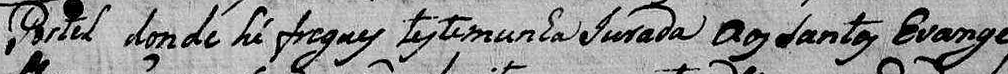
Portel donde hé fregues testemunha Iurada Aos Santos Evange
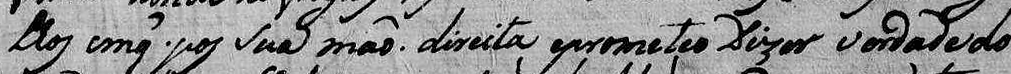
lhos em q̄ .pos sua maõ. direita e prometeo Dizer verdade do
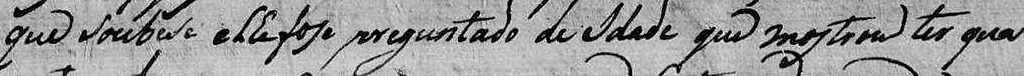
que soubese e lhe fose preguntado de Idade que mostrou ter qua
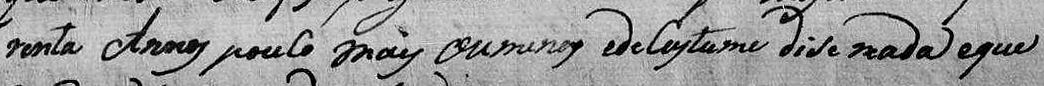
renta Annos pouCo mais ou menos e de Custume dise nada e que
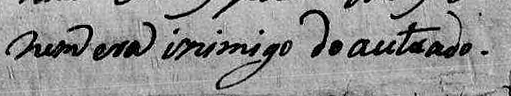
nem era inimigo do autoado.
